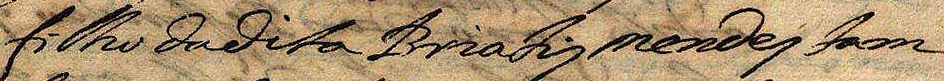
filho da dita Briatiz mendez tam
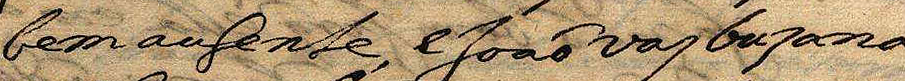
bem ausente, e Joaõ vaz buzana
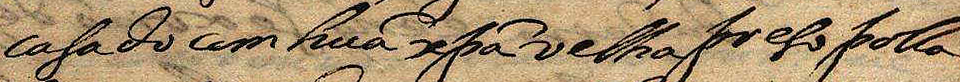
casado com huā xpā velha preso polla
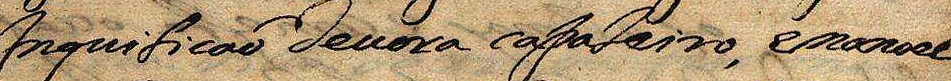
Jnquisicaõ deuora capateiro, e manoel
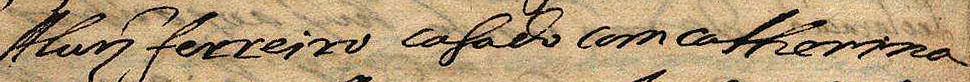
Alurz̄ ferreiro casado com catherina
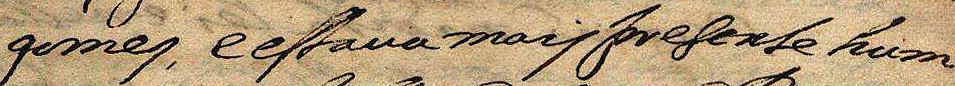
gomez, e estaua mais presente hum
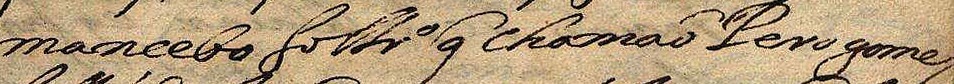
mançebo soltro q̄ chamaõ Pero gomez
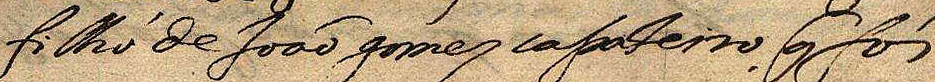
filho de Joaõ gomez capateiro, q̄ foi
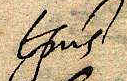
tpus̄
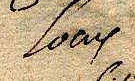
locus
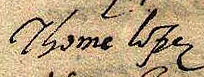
Thome lopez
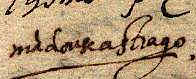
mādouse a s̄tiago
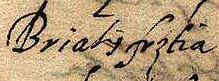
Briatis frz tia
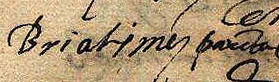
Briatis mēz parēta
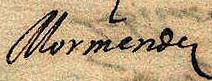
Mor mendez
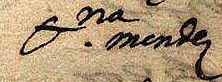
C.na mendez
